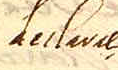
declaraç.
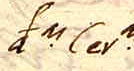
d̄.as Cer.as
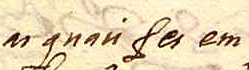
as quasi fes em
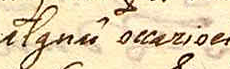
alguās occaziões
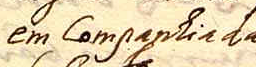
em Companhia da
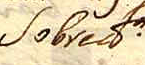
Sobred.a
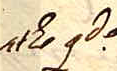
athe q.do
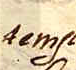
temp
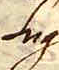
Lug
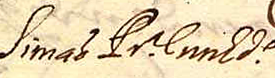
Simaõ Pr.a Cunhd.o
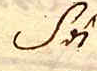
Sôs
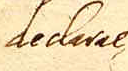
declaraç
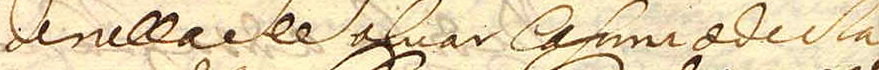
de nella Se Saluar E asim o decla
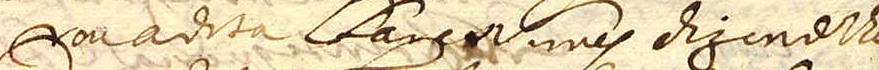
rou a dita Clara Nunes dizendlhe
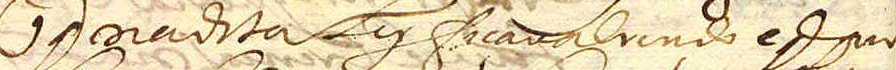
q̄ na dita Ley ficava crendo e q̄ por
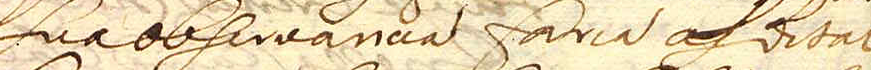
sua observancia faria as ditas
